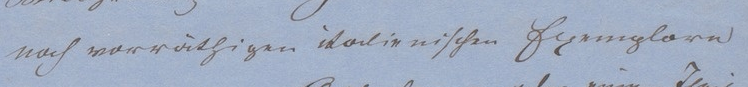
noch vorräthigen italienischen Exemplare
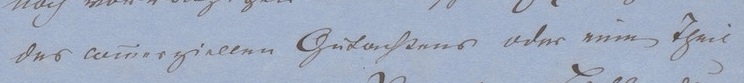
des commerziellen Gutachtens oder einen Theil
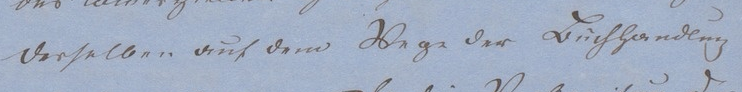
desselben auf dem Wege der Buchhandlung
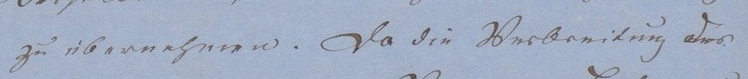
zu übernehmen. Da die Verbreitung des
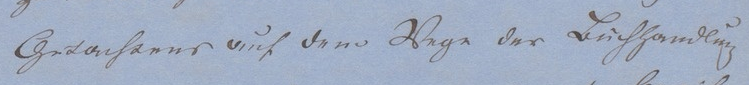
Gutachtens auf dem Wege der Buchhandlung
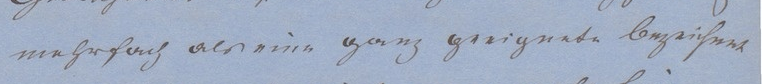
mehrfach als eine ganz geeignete bezeichnet
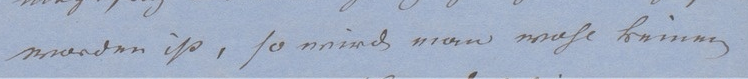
worden ist, so wird man wohl keinen
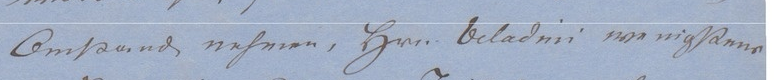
Anstand nehmen, Hrn. Veladini wenigstens
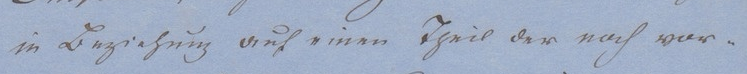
in Beziehung auf einen Theil der noch vor-
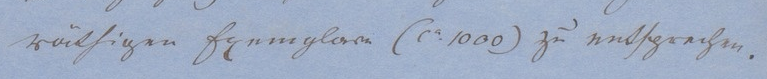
räthigen Examplare (ca 1000) zu entsprechen.
